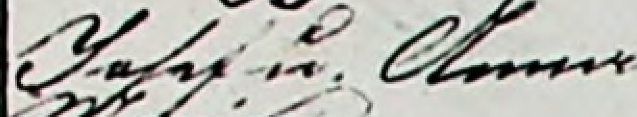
Josef u. Anna
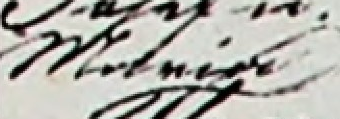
Maria
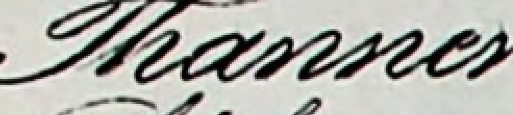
Thanner
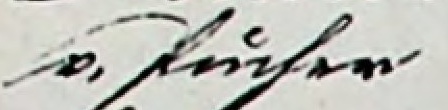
v. Pucher
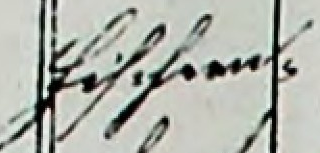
Fischern
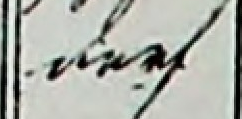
dorf
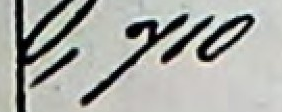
0,710
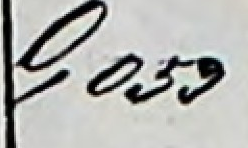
0,053
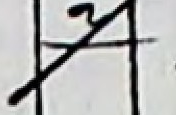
7
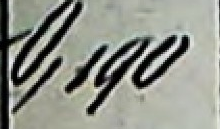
0,190
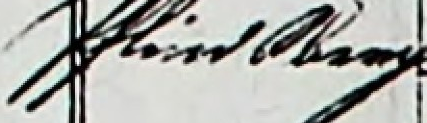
Pflindsberg
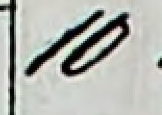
10
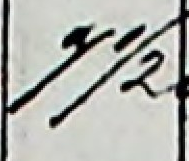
7 ½
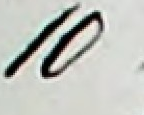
10
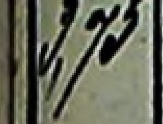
3,75
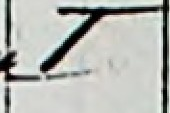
I
